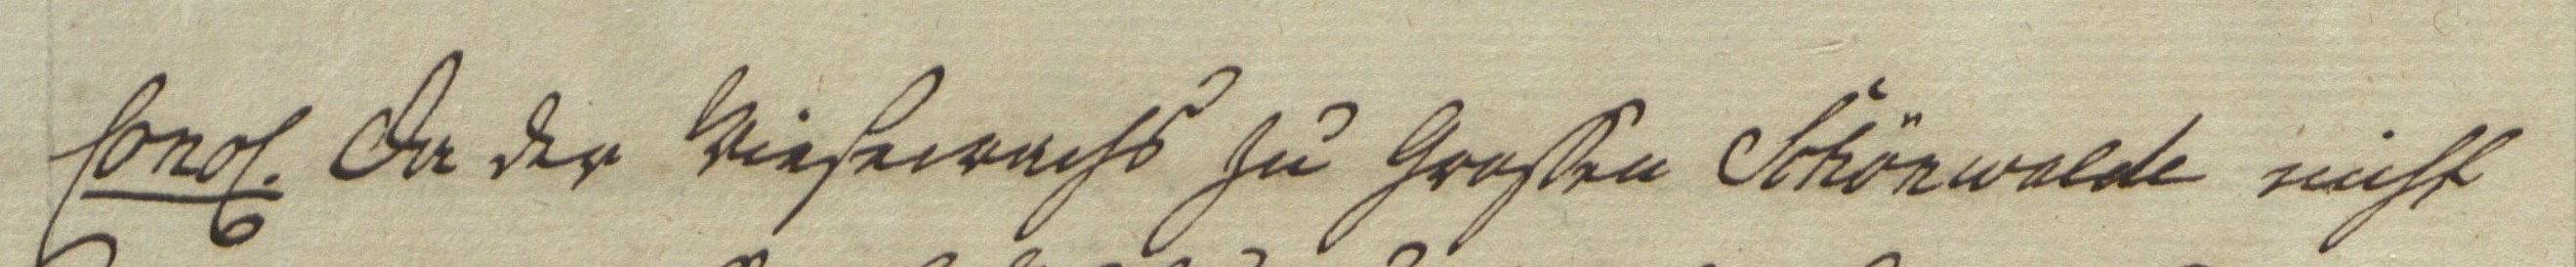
Concl. Da der Wiesenwachs zu Grossen Schönwalde nicht
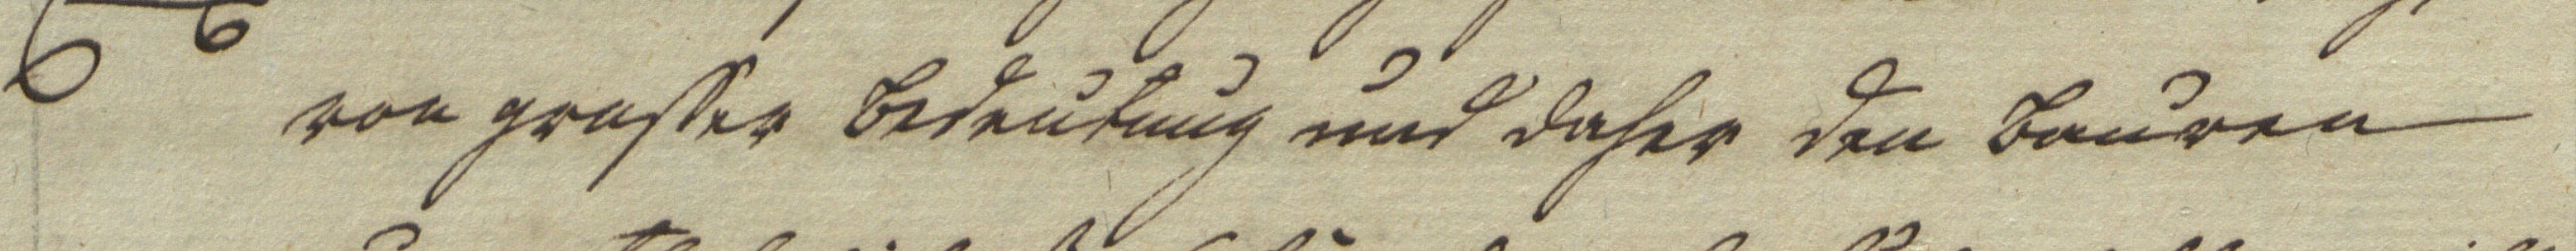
von grosser Bedeutung und daher den Bauren
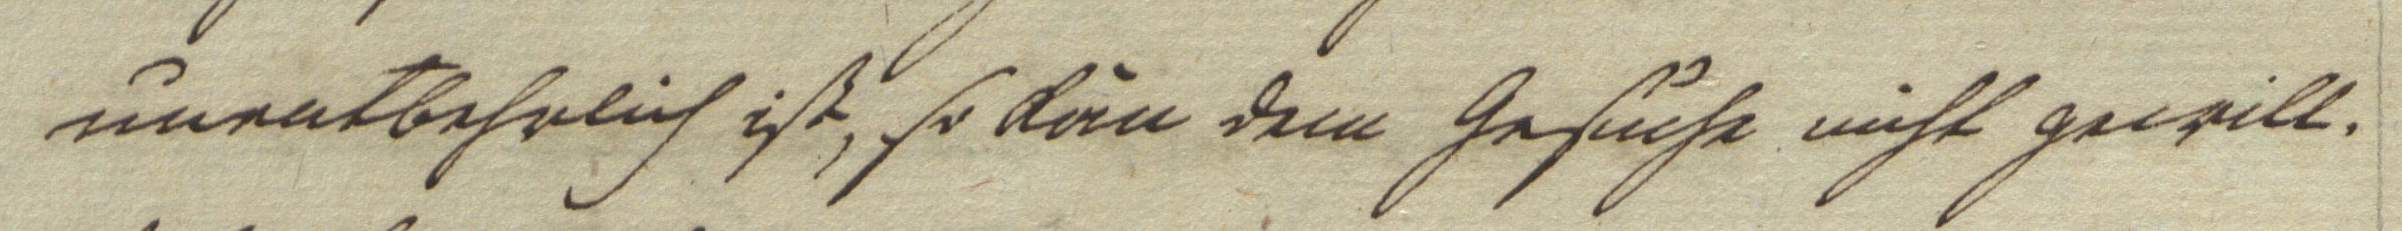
unentbehrlich ist, so kan dem Gesuche nicht gewill¬
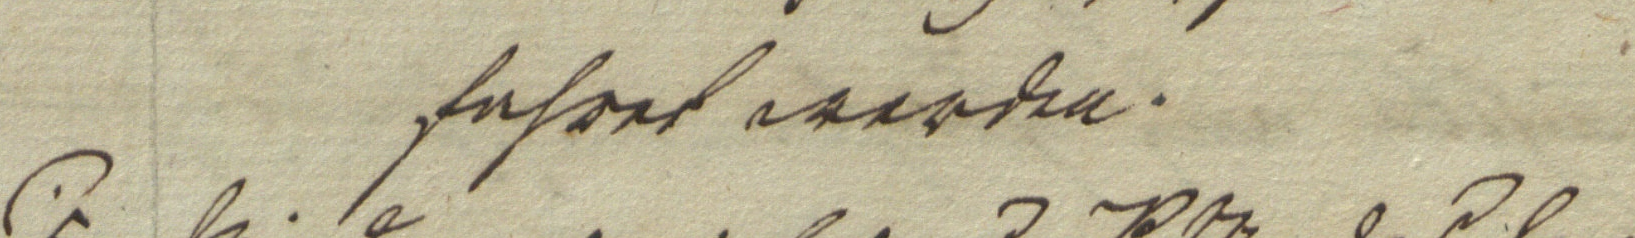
fahret werden.
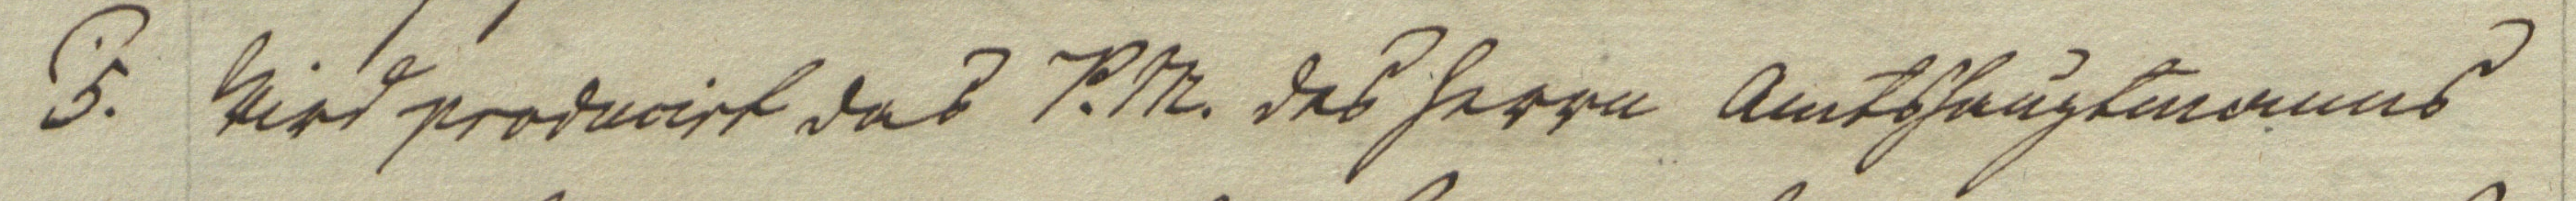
5. Wird producirt das P. M. des Herrn Amtshauptmanns
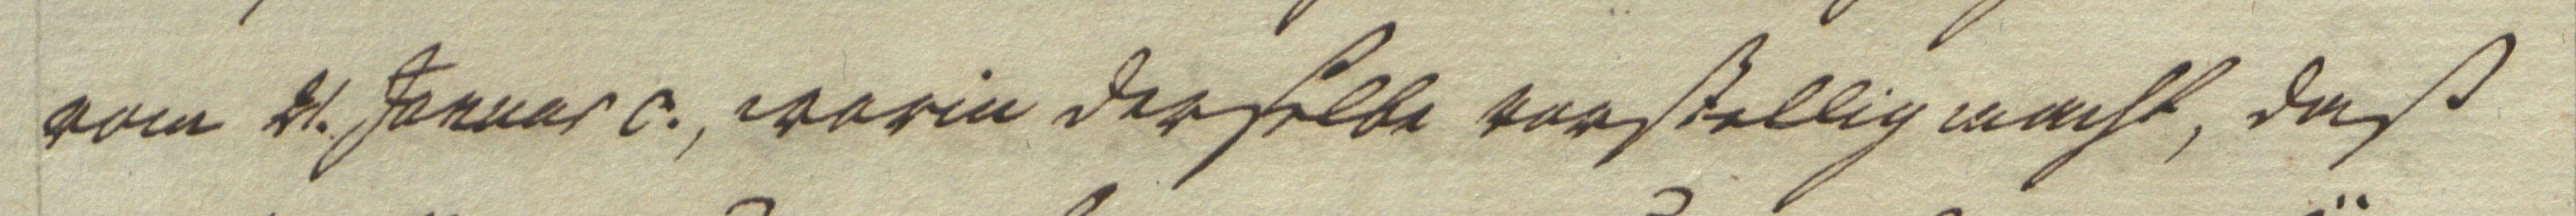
vom 21. Januar c., worin derselbe vorstellig macht, daß
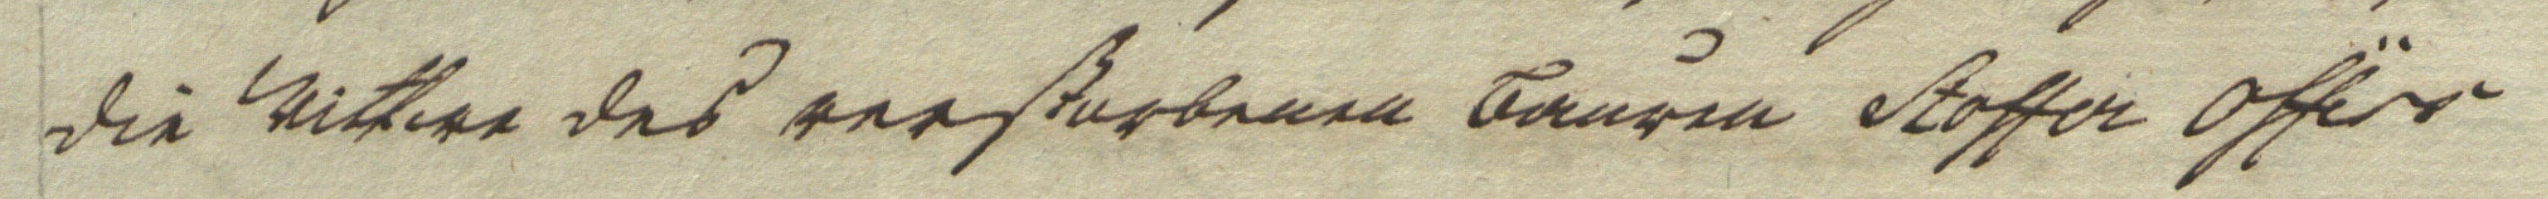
die Wittwe des verstorbenen Bauren Stoffer Offers
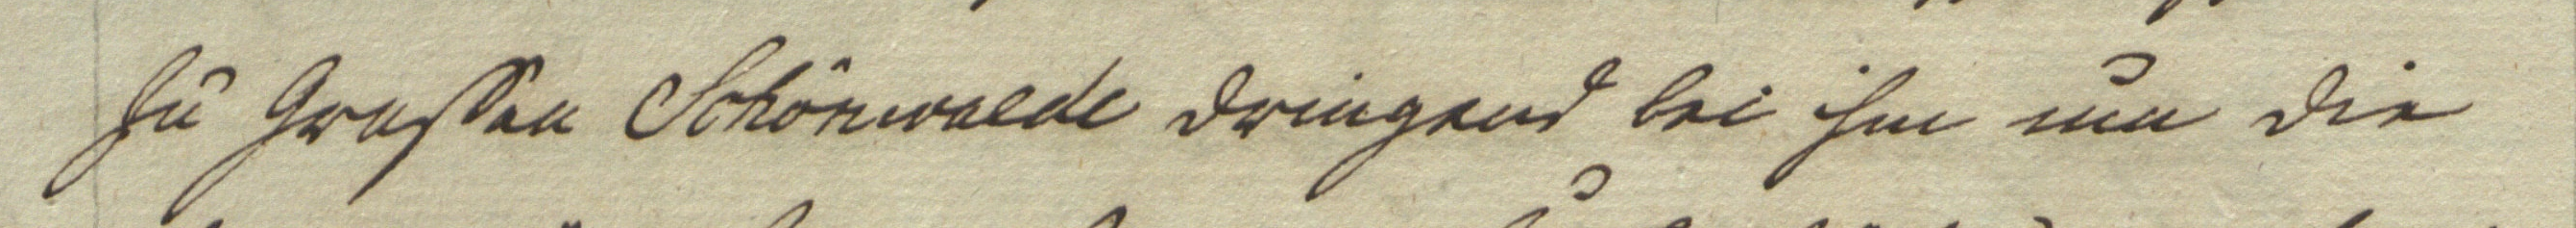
zu Grossen Schönwalde dringend bei ihm um die
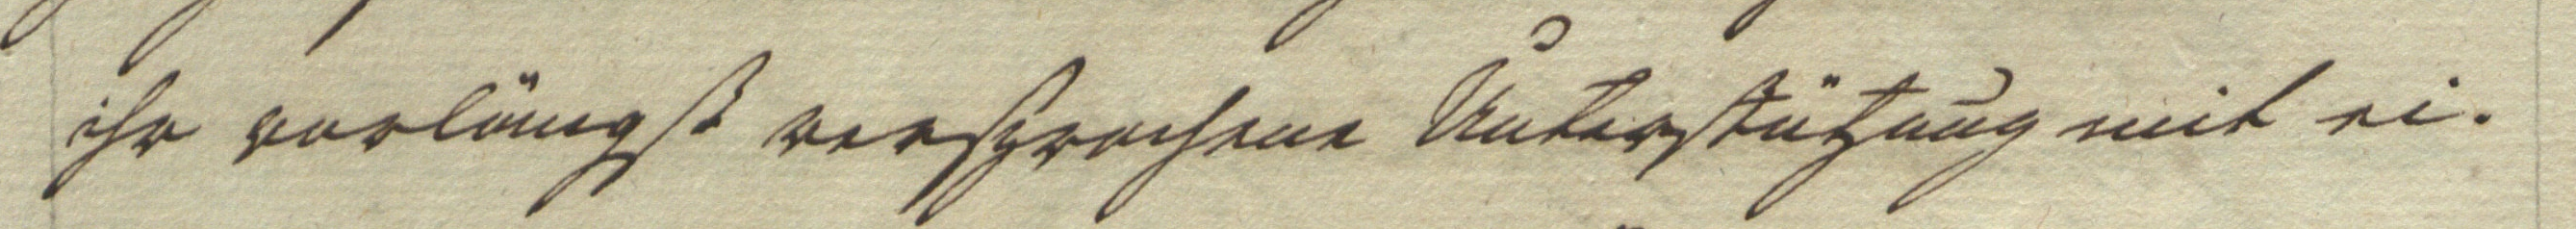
ihr vorlängst versprochene Unterstützung mit ei¬
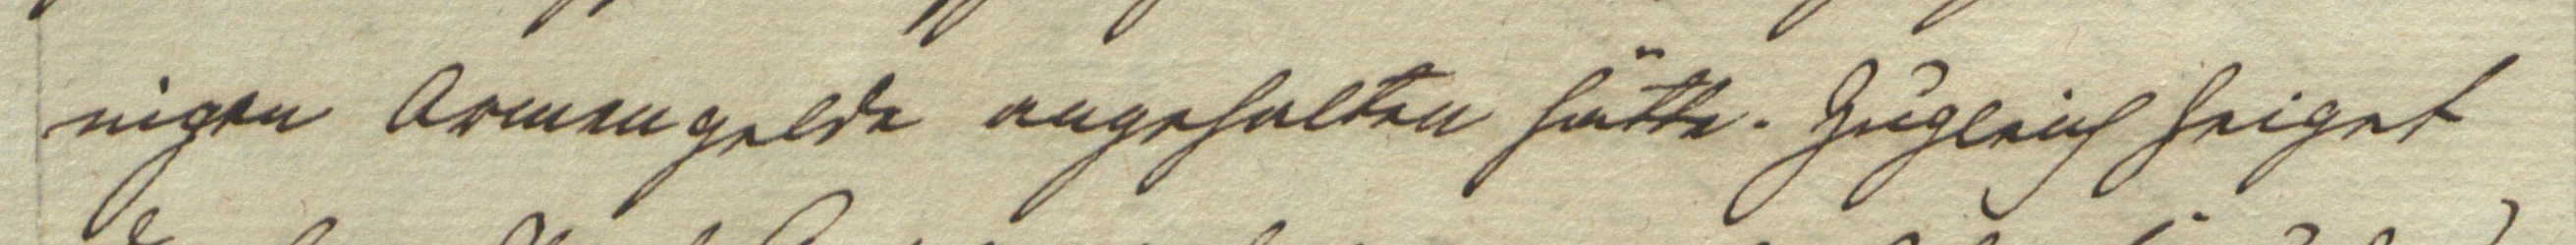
nigen Armengelde angehalten hätte. Zugleich zeiget
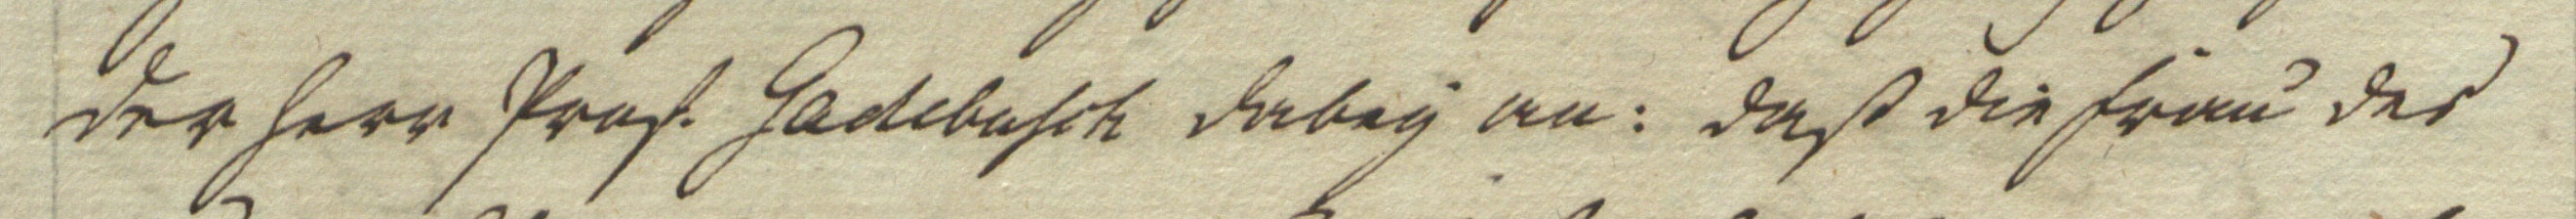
der Herr Prof. Gadebusch dabey an: daß die Frau des
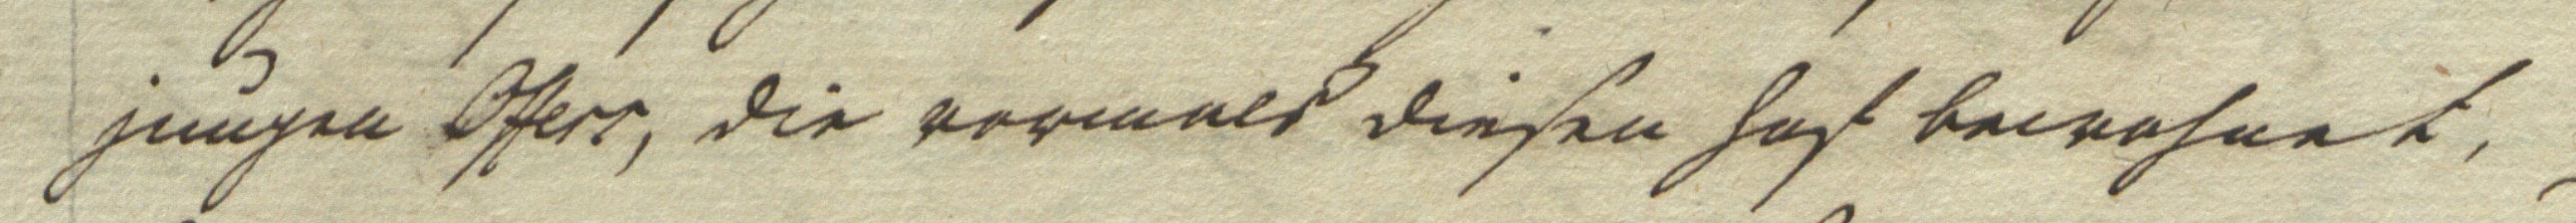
jungen Offers, die vormals diesen Hof bewohnet,
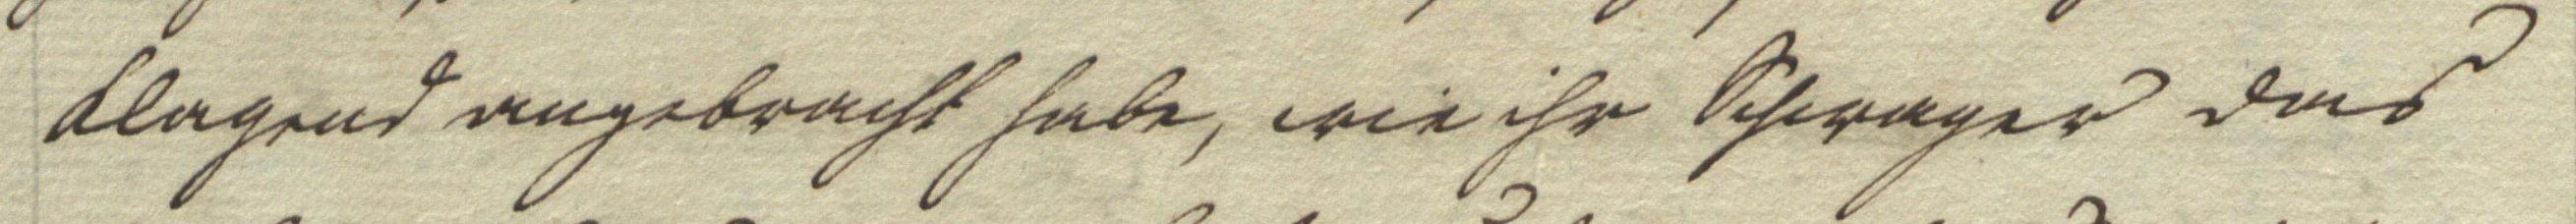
klagend angebracht habe, wie ihr Schwager das
